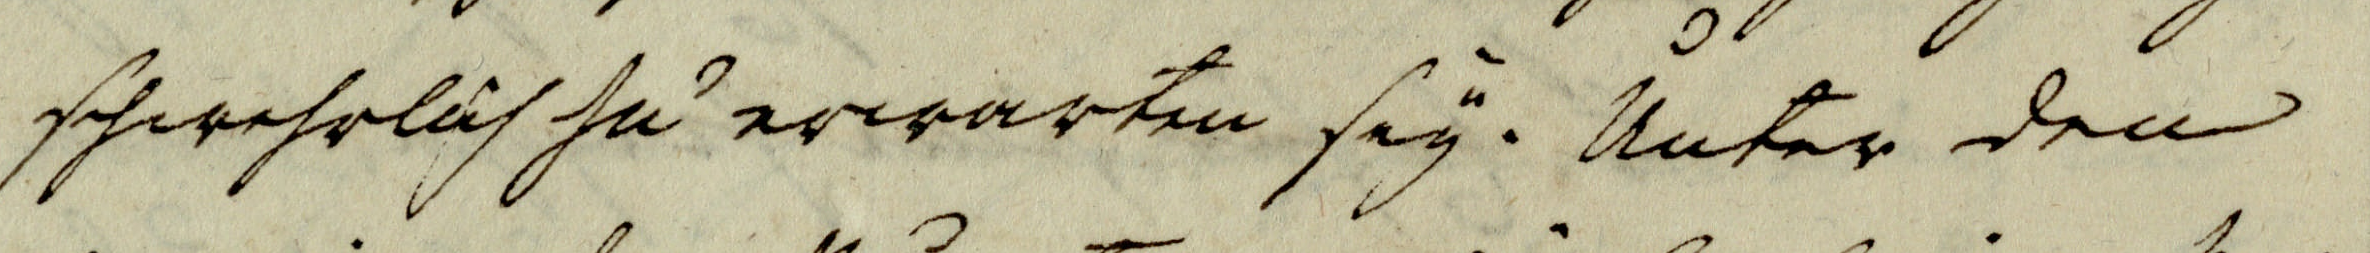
schwehrlich zu erwarten seÿ. Unter den
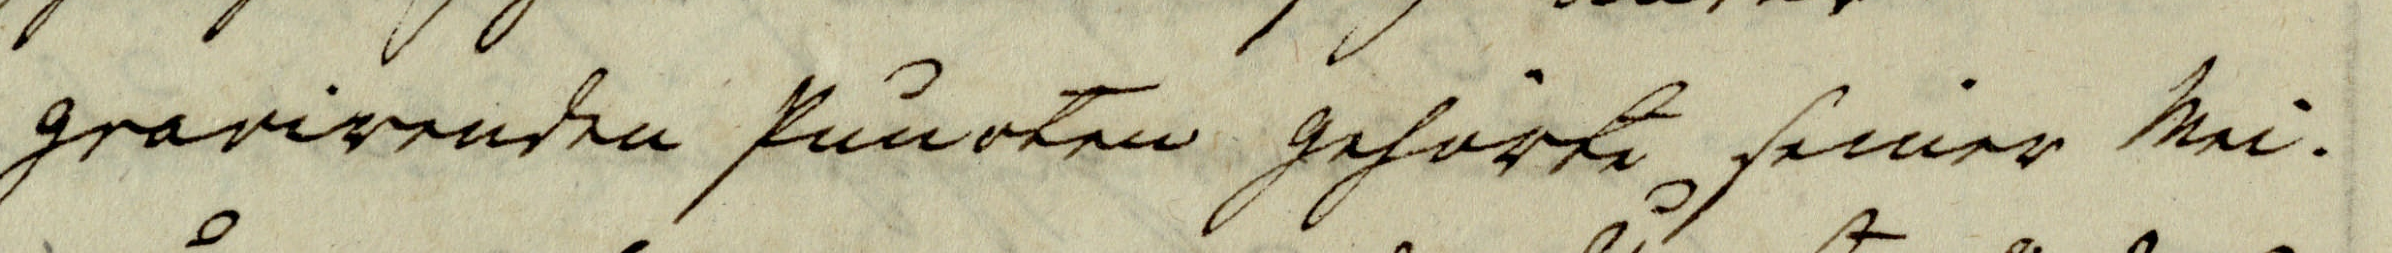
gravirenden Puncten gehörte, seiner Mei¬
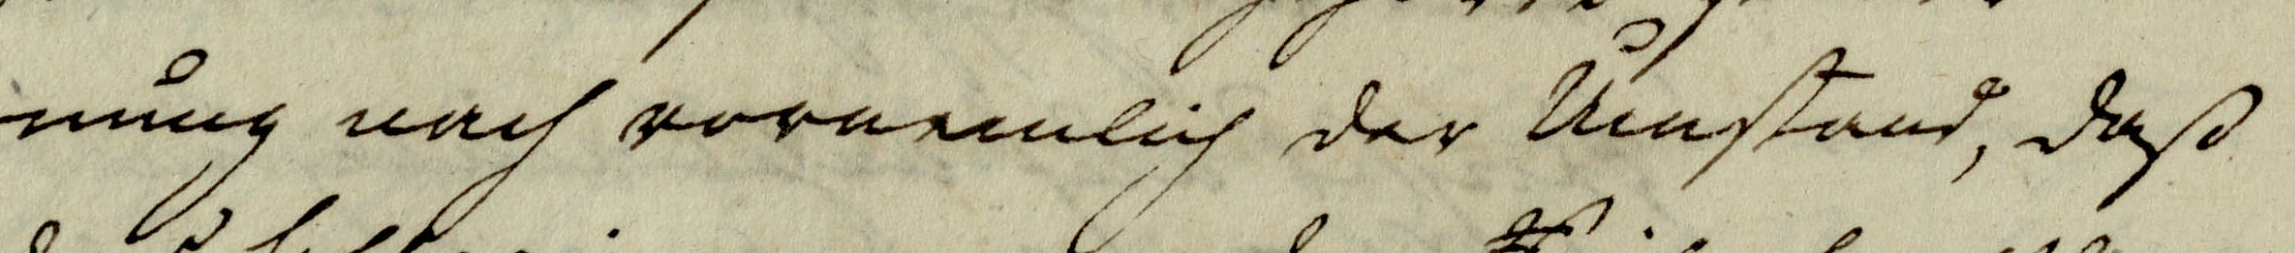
nung nach vornemlich der Umstand, daß
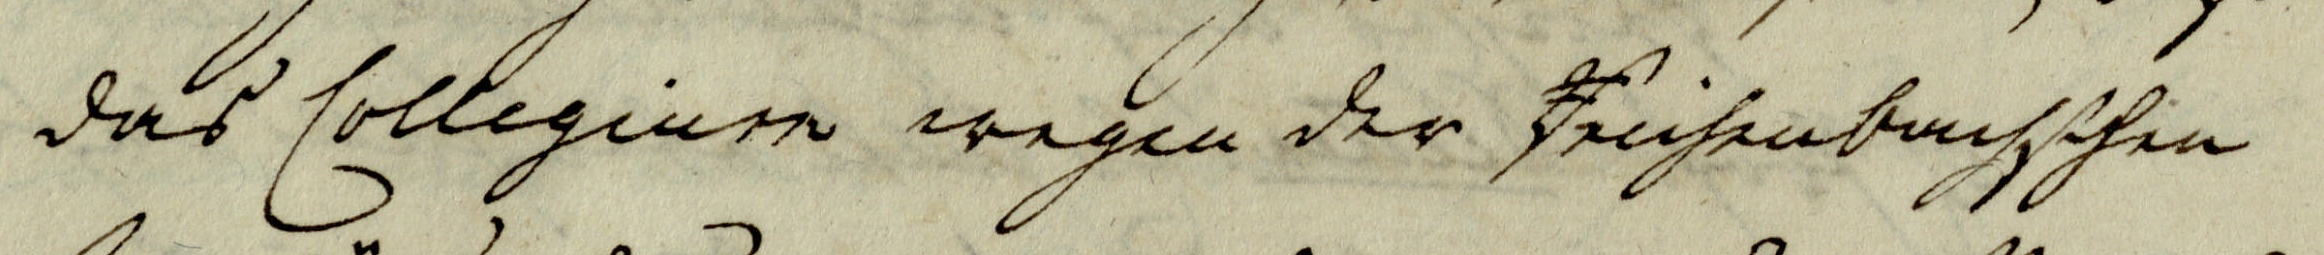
das Collegium wegen der Reichenbachschen
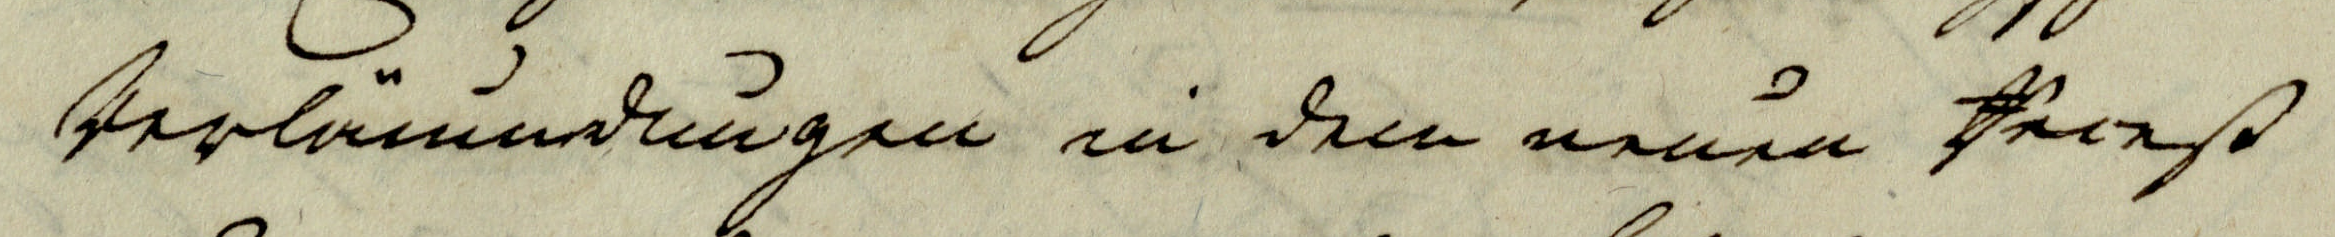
Verläumdungen in dem neuen Receß
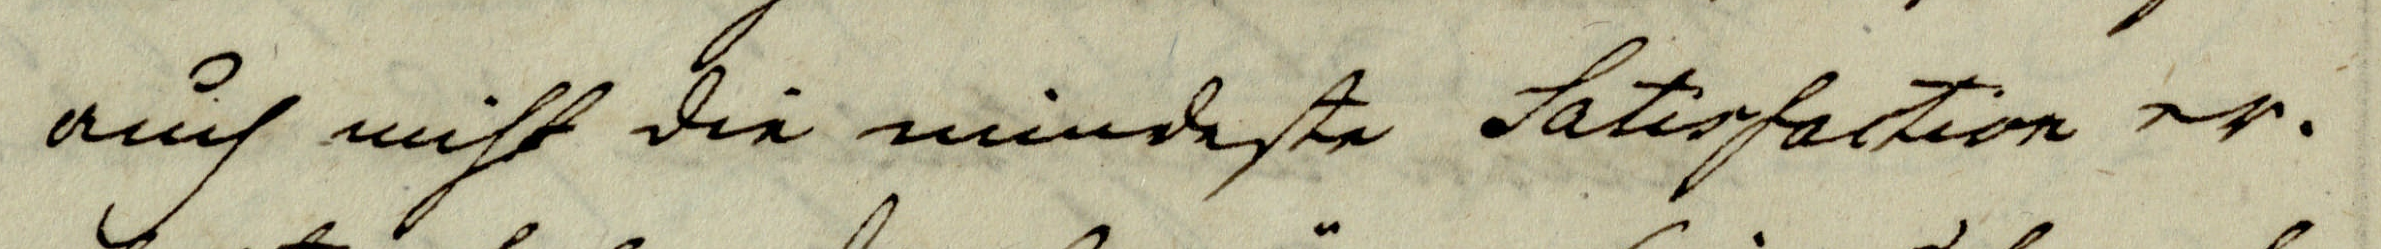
auch nicht die mindeste Satisfaction er¬
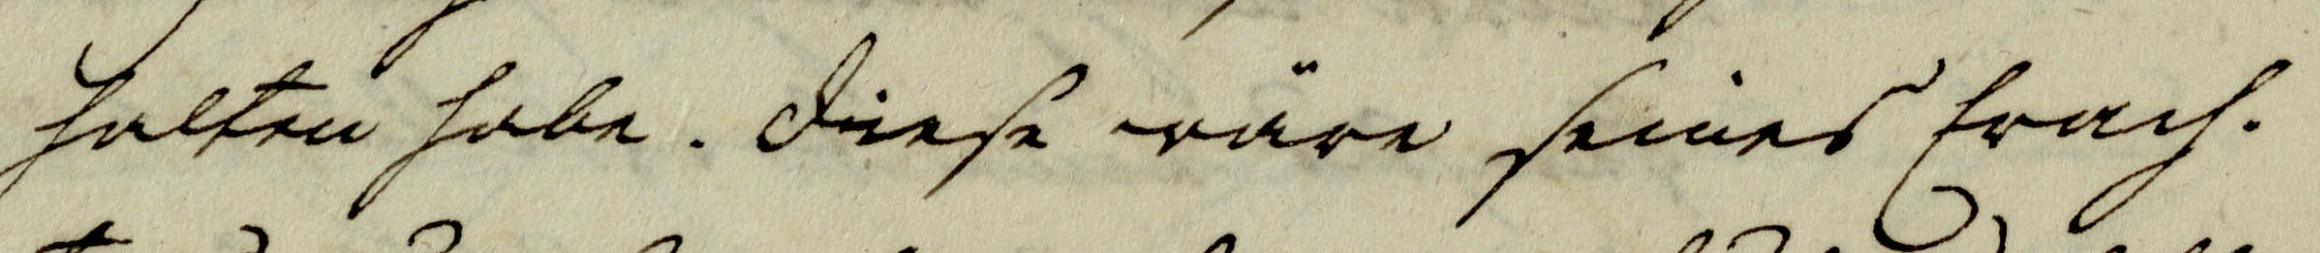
halten habe. Diese wäre seines Erach¬
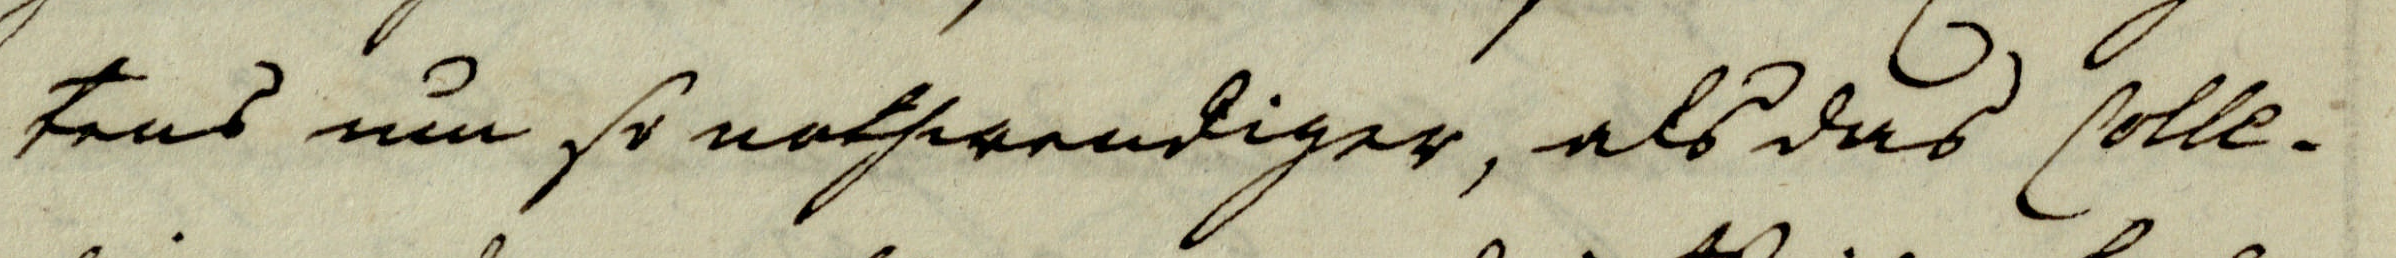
tens um so nothwendiger, als das Colle¬
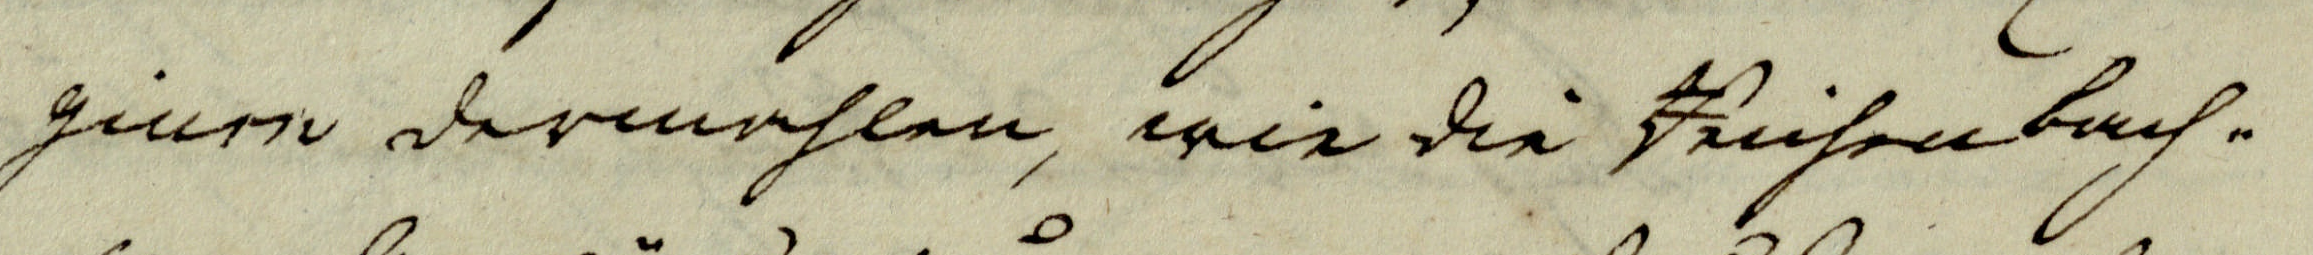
gium dermahlen, wie die Reichenbach¬
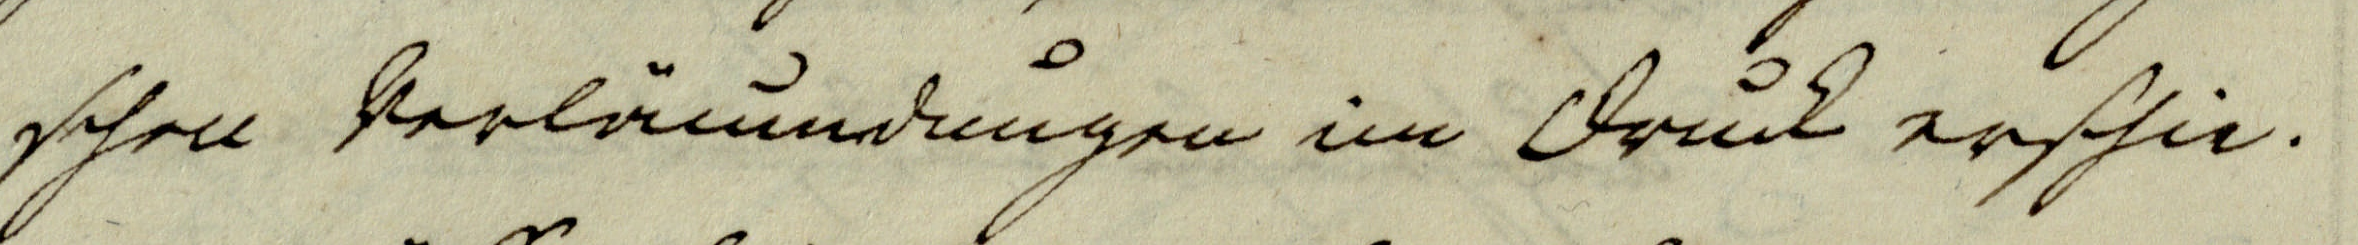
schen Verläumdungen im Druck erschie¬
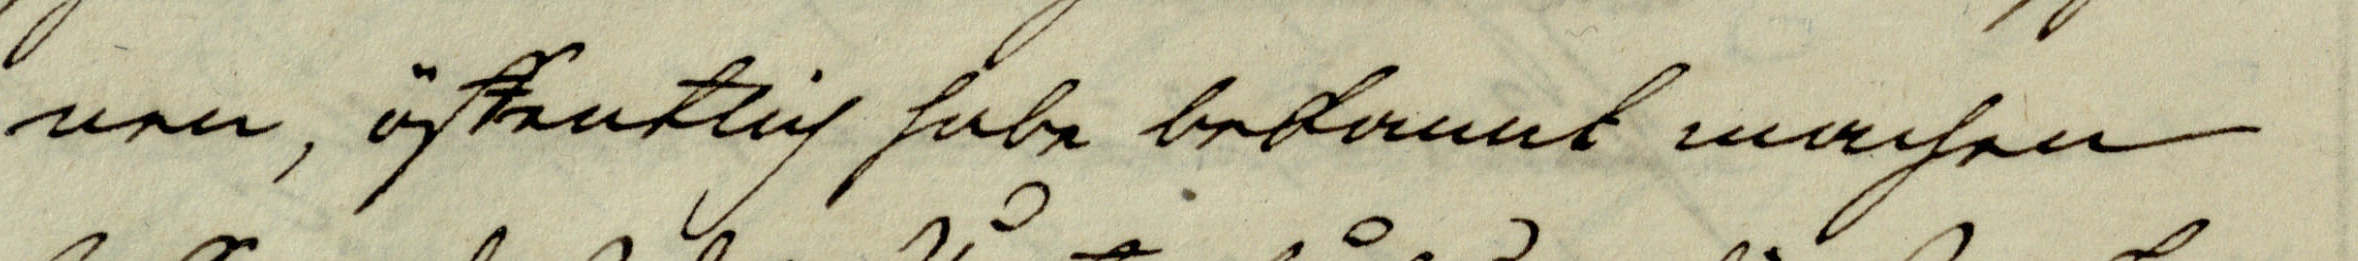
nen, öffentlich habe bekannt machen
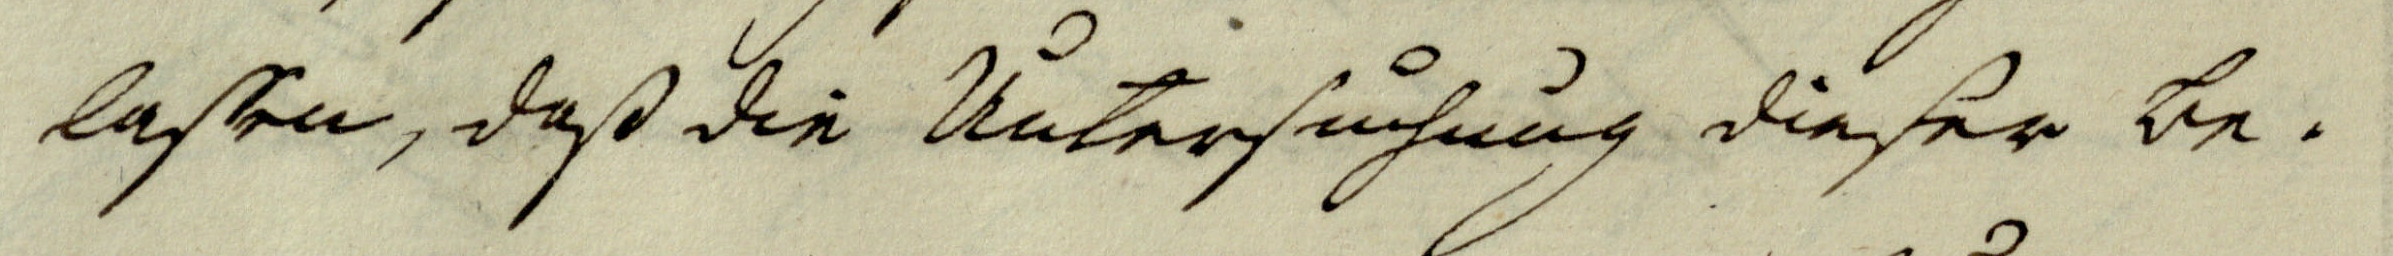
lassen, daß die Untersuchung dieser Be¬
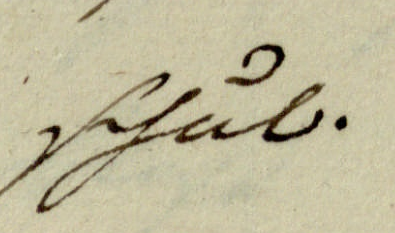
schul¬
